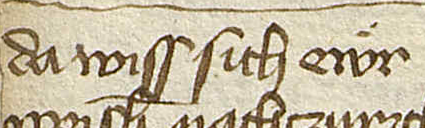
da wiſſ ſich eẅr
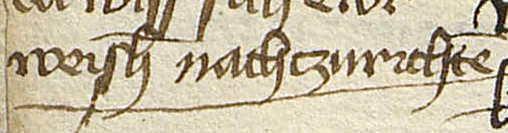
weiſh* nachcʒurichte*
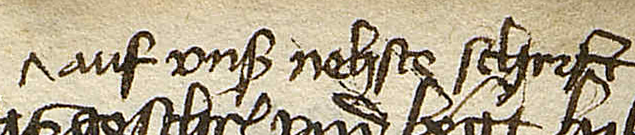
auf vnſ* nehſte ſchrift
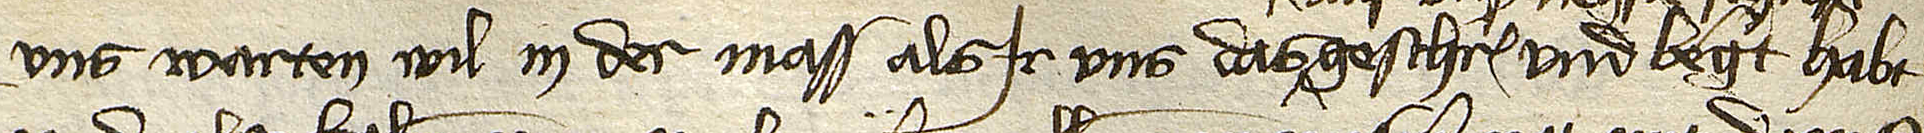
vns warten wil in der maſſ als Ir vns das geſchr* vnd beg*t habt
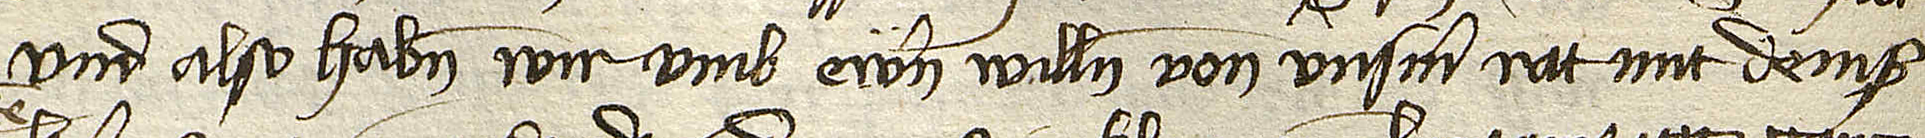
vnd alſo habn* wir vmb eẅ*n willn* von vnſm* rat mit demſ*
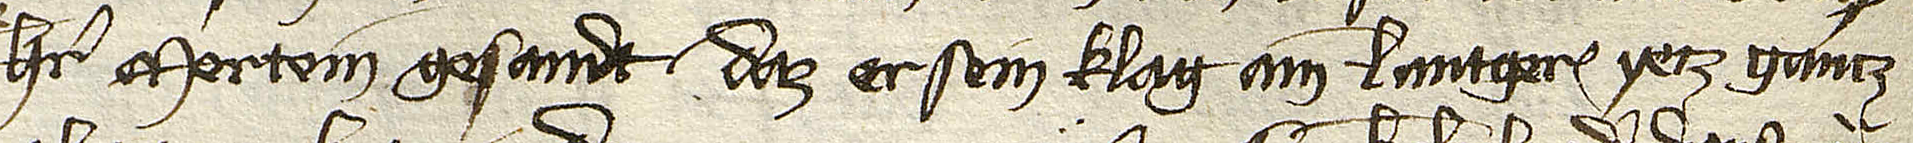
hr* Mertein geſandt / daʒ er ſein klag am* lantger* yecʒ gancʒ
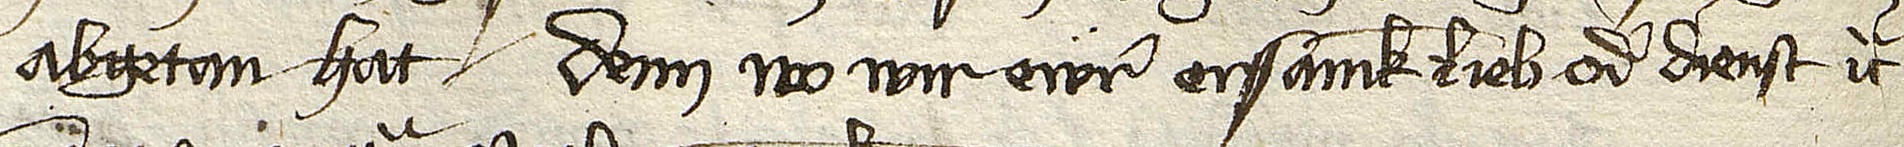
abgetan hat / Denn wo wir eẅr* erſamk* lieb od* dienſt ec*
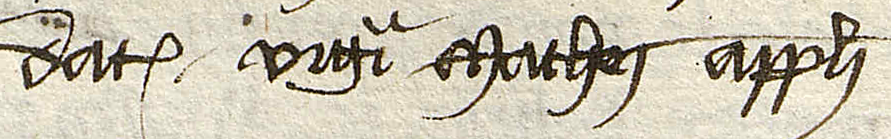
Dat* / vigi* Mathei appli*
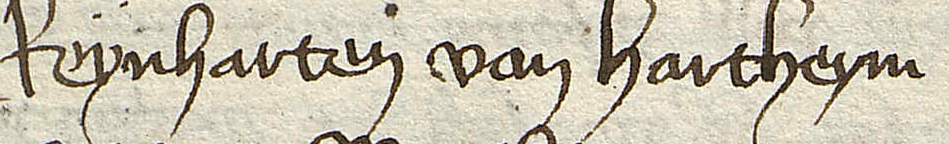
Reynharten von hartheym
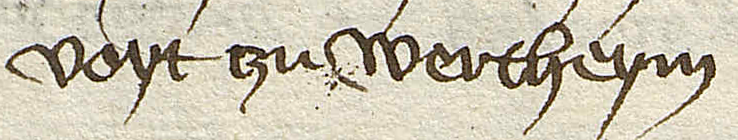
voyt cʒu wertheym
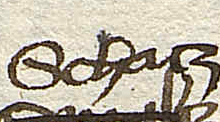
Schacʒ
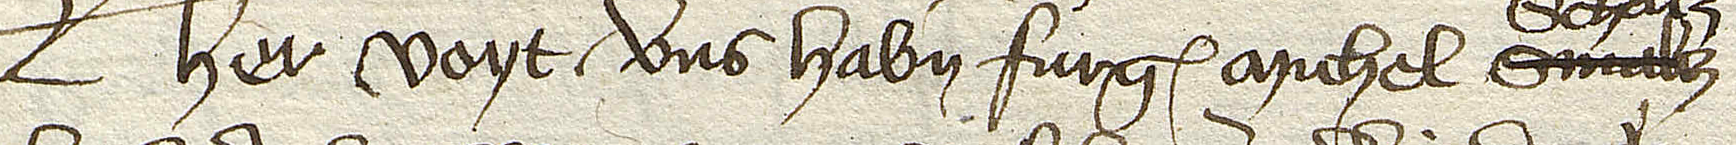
L* her voyt / Vns habn* fürg* Michel Smalcʒ
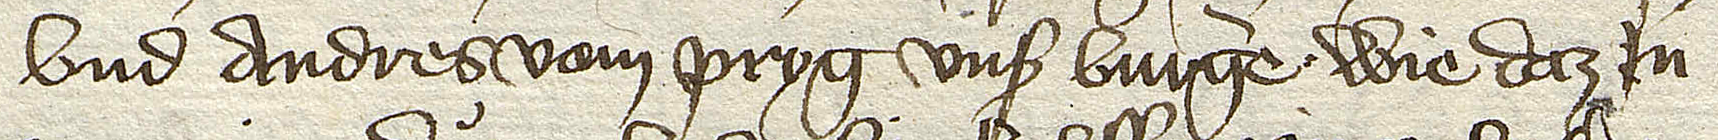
vnd Andres vom pryg vnſ* burge* . Wie daʒ In
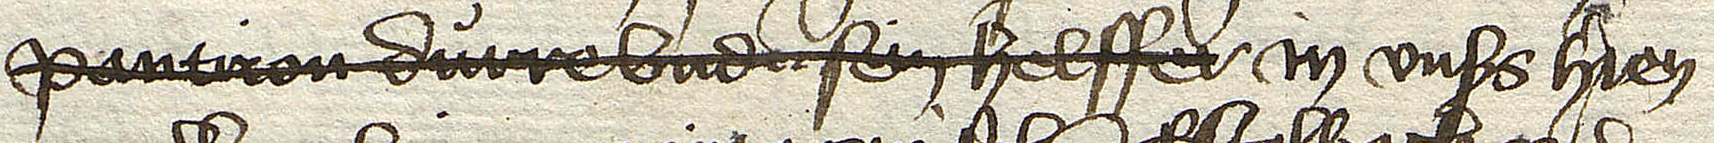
pantrion Dürre vnd ~ ſein helffer in vnſ*s h*ren
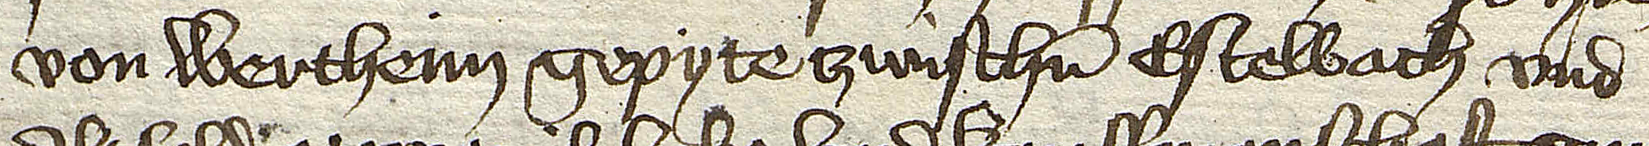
von Wertheim gepyte cʒwiſchn* Eſtelbach vnd
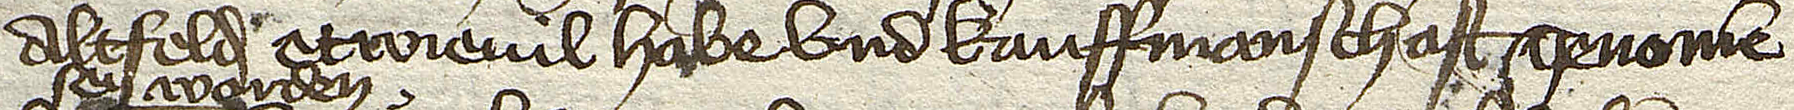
Altfeld* etwieuil habe vnd kauffmanſchaft genome*
